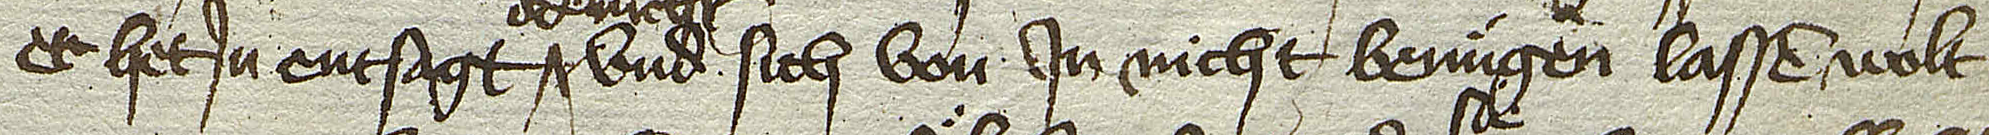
er het In entſagt / vnd ſich von In nicht benügen laſſe* wolt
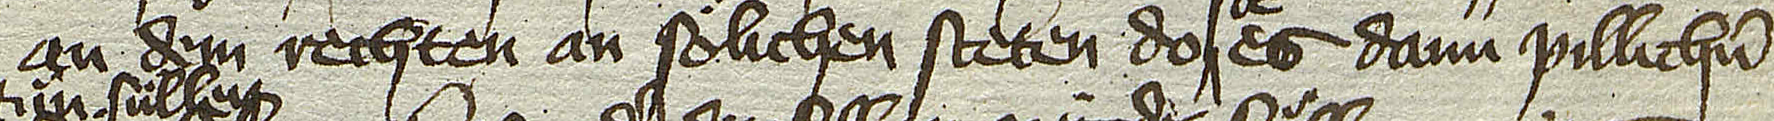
an dem rechten an ſölichen ſteten do es dann pillichn*
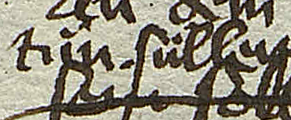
tün ſüllen
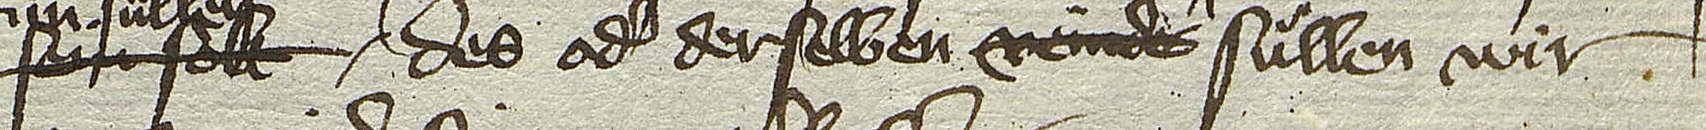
ſein ſölt / Des od* derſelben veinde ſüllen wir
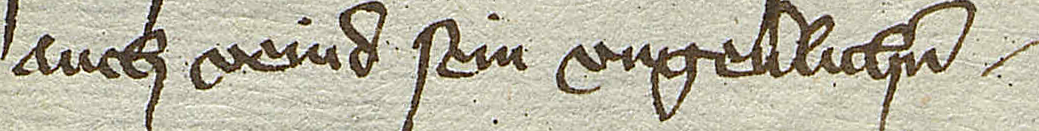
auch veind ſein vngeu*lichn* /
